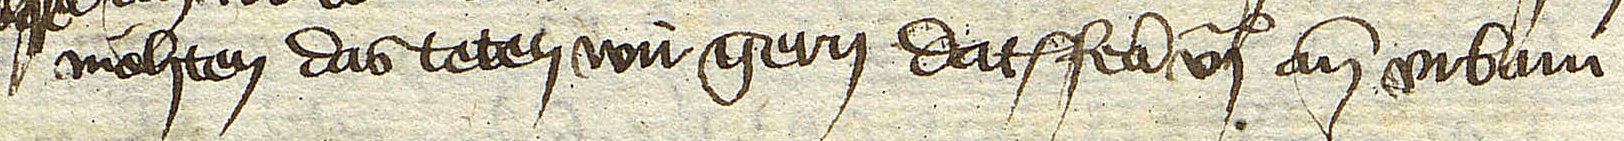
möhten das teten wir gern dat* fea* vi* an* vrbani
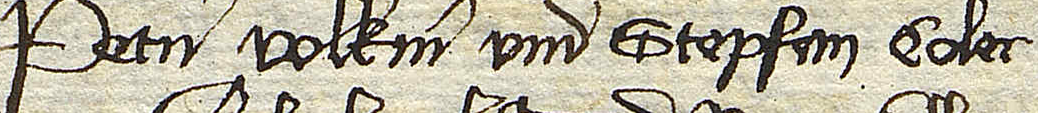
Pet*n volkm* vnd Stepfan Coler
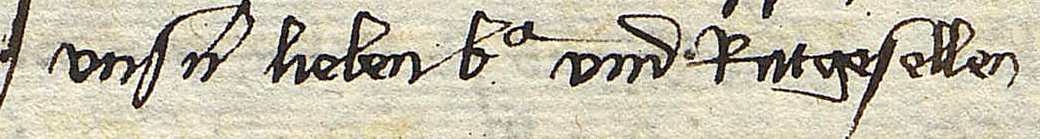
vnſ*n lieben b* vnd Ratgeſellen
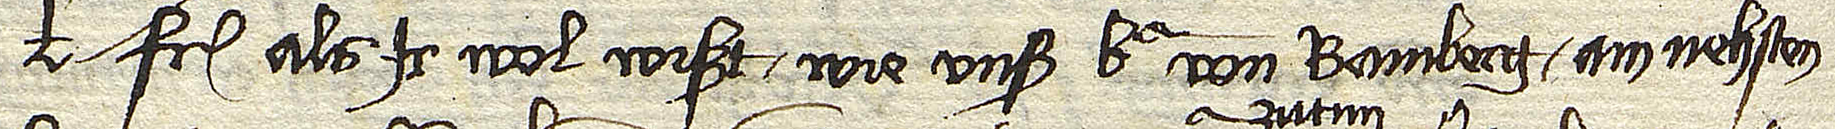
L* fr* als Ir wol wiſʒt / wie vnſ* b* von Bamberg / am nehſten
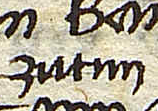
ʒutun
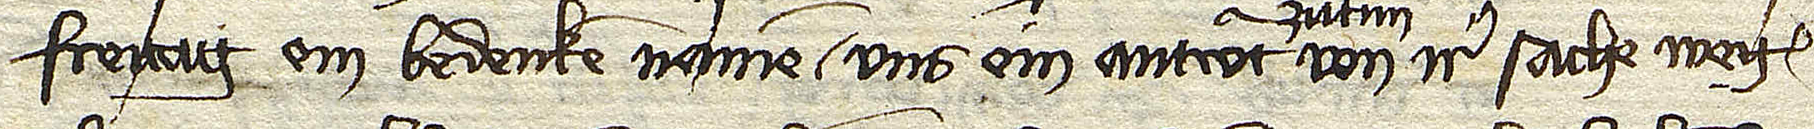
freitag ein bedenke* name* / vns ein antw*t von ir* ſache weg*
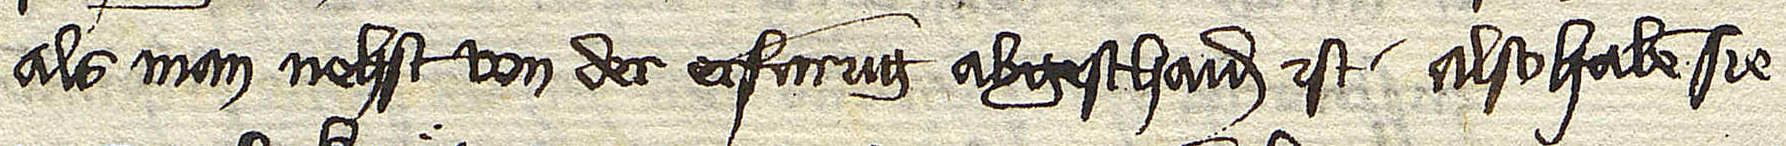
als man nehſt von der erfaru*g abgeſchaid* iſt / Alſo habe* ſie
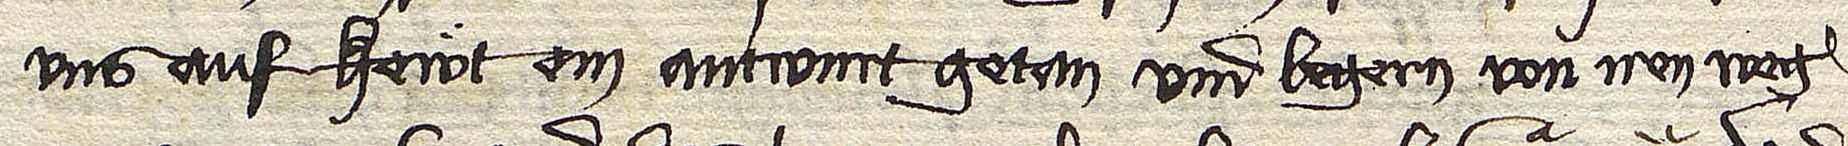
vns auf hewt ein antwurt getan vnd begern von iren weg*
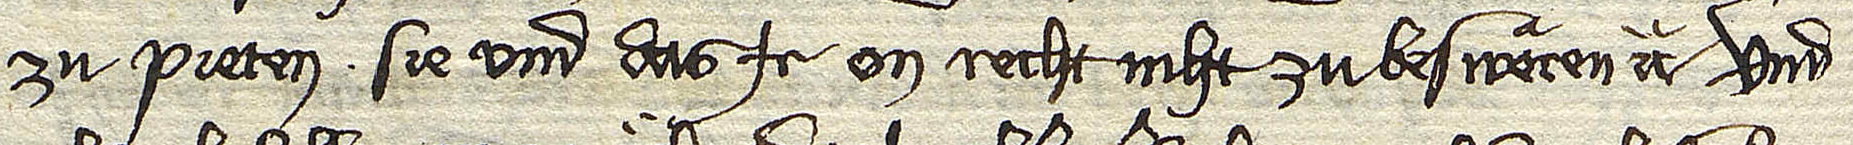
ʒu pieten . ſie vnd das Ir on recht niht ʒu beſwëren ec* / Vnd
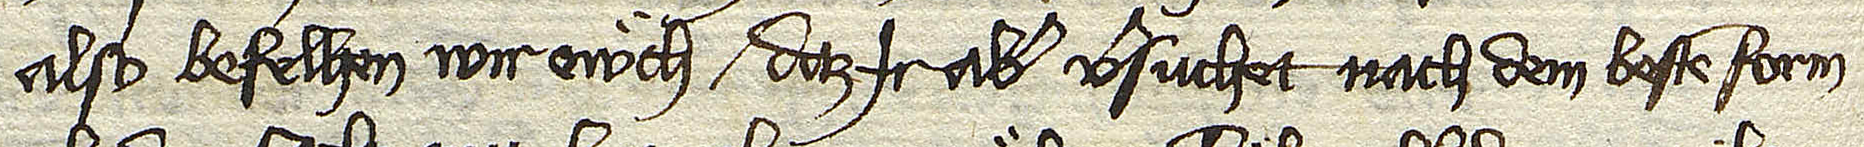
alſo befelhen wir ewch / daʒ Ir ab* v*ſuchet nach dem beſte* form
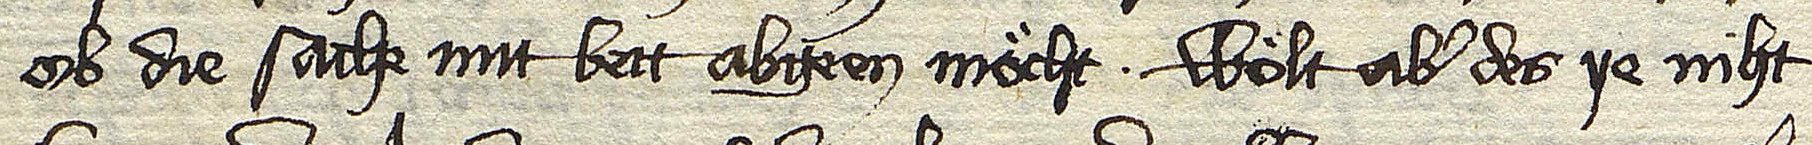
ob die ſache mit bett abgeen möcht . Wölt ab* des ye niht
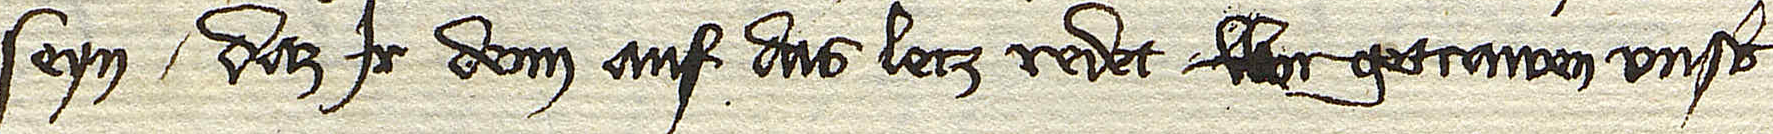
ſeyn / daʒ Ir denn auf das lecʒ redet . Wir getrawen vnſ*s
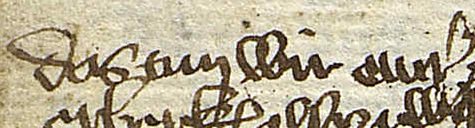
das tun wir ew*r
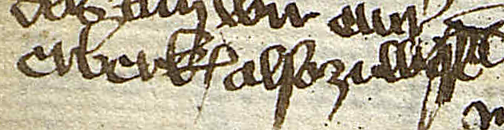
erberk* alſo ʒu wiſſe*
